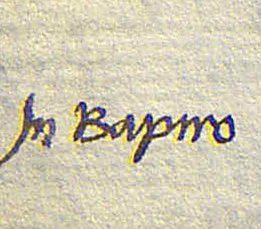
In Bapiro
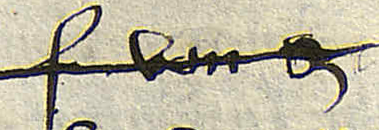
f . von Cʒ
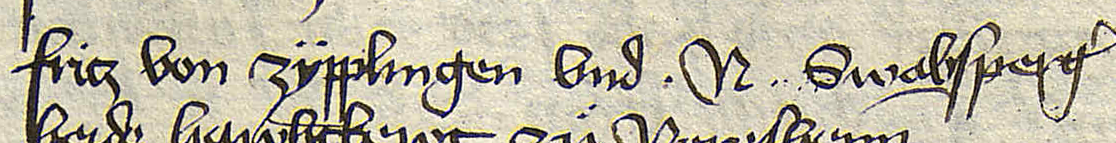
fricʒ von cʒypplingen vnd . N . Swabſperg*
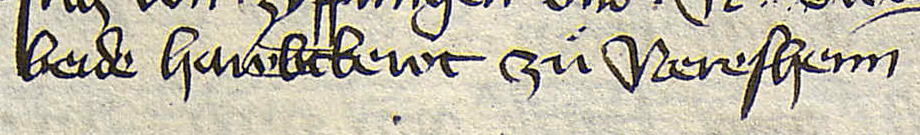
beide hawbtlewt cʒü Nereſheim
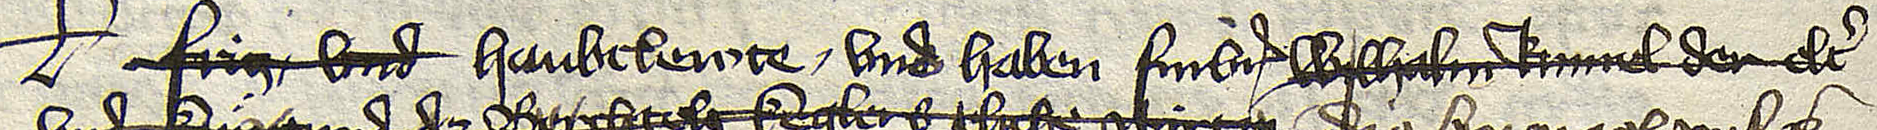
L* fricʒ / vnd hawbtlewte / vns haben furbr* wilhalm Rumel der elt*
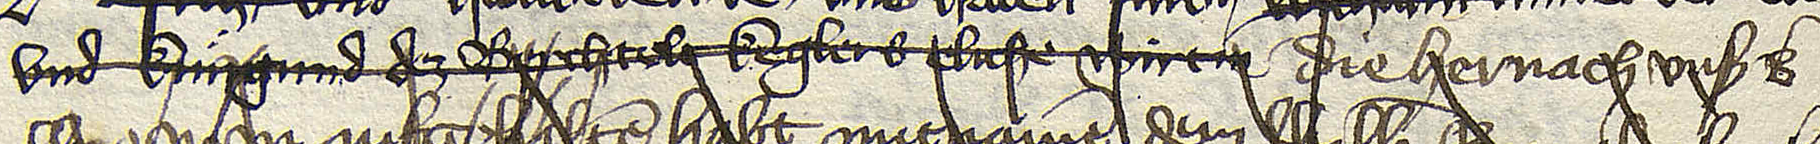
vnd küngund deʒ Berchtolt keglers eliche wirtin / die hernach vnſ* B*
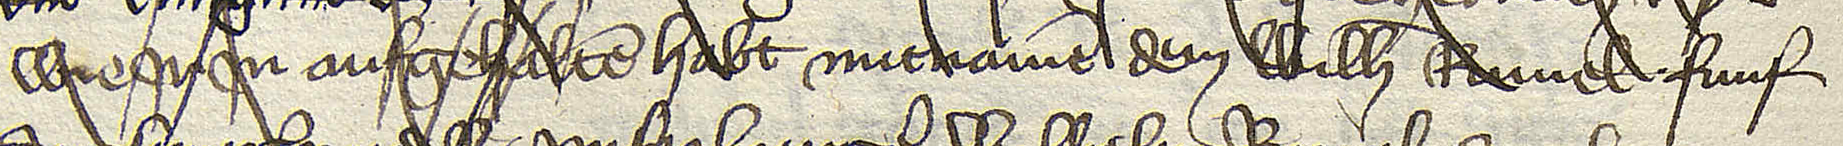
wie Ir In aufgehalte* habt mitname* dem wilh* Rumel funf
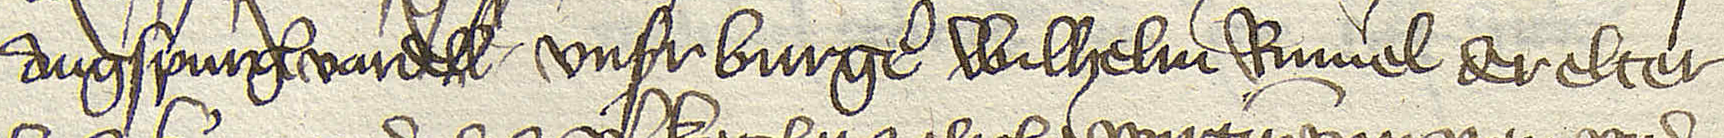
Augſpurg* vardell / vnſ*r burge* wilhelm Rumel der elter
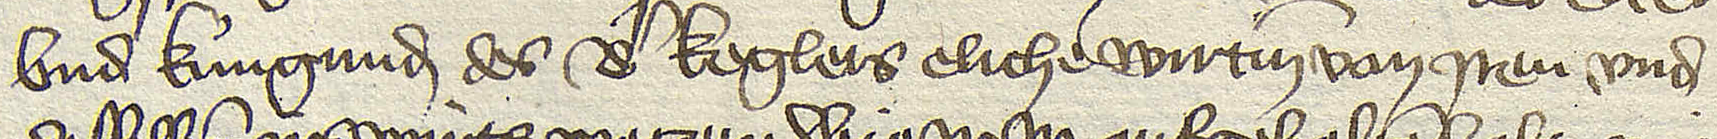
vnd küngund* des B* keglers eliche wirtin* von Iren vnd
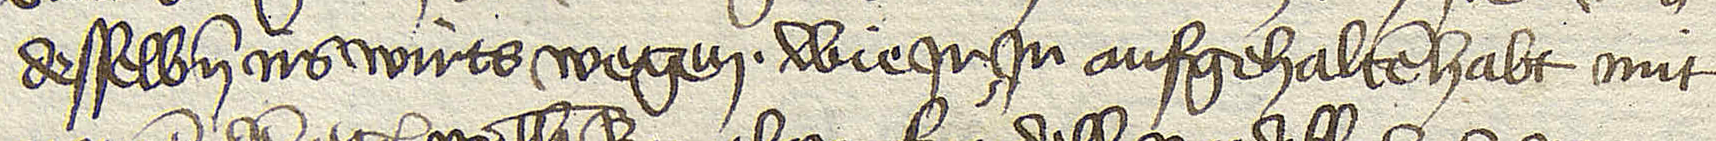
deſſelbn* irs wirts wegen . wie Ir In aufgehalte* habt mit
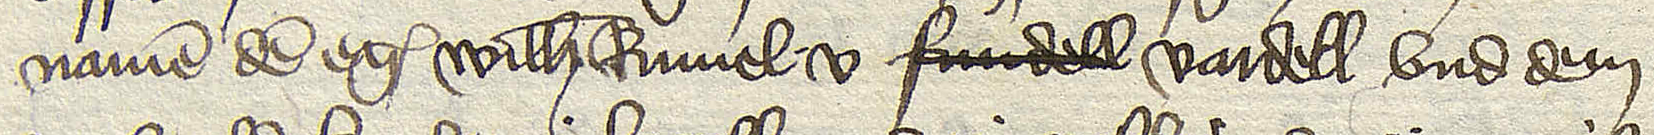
name* d* eg* wilh* Rumel . v fündell vardell vnd dem
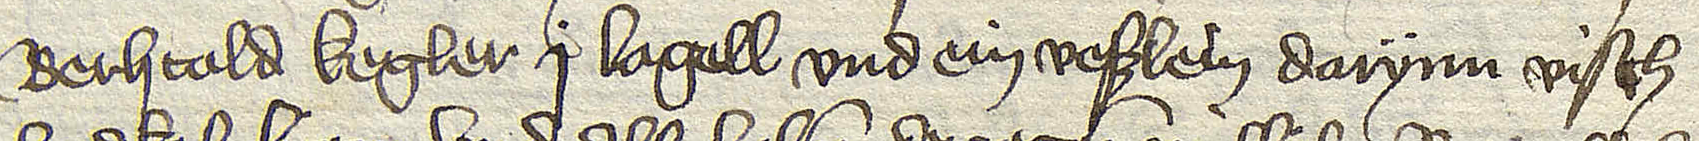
Berthold kegler i lagell vnd ein veſʒlein darynn viſch
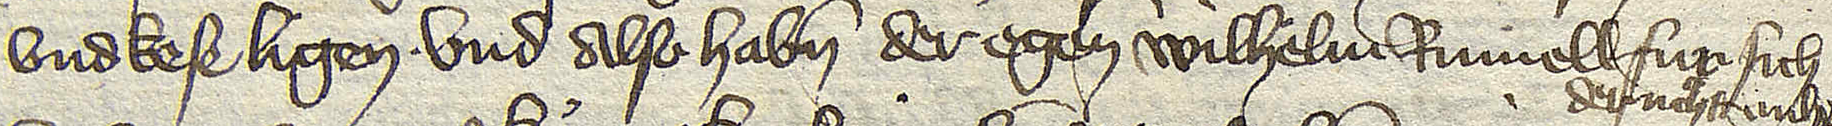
vnd keſe ligen . vnd Alſo habn* der egen* wilhelm Rumell fur ſich
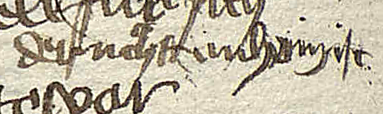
der niht anheim iſt
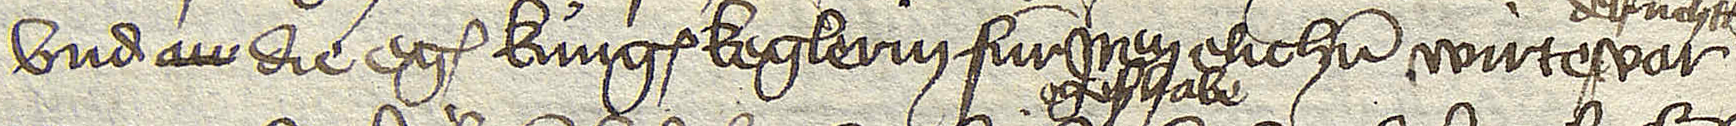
vnd aw die eg* küng* keglerin für Iren elichn* wirte vor
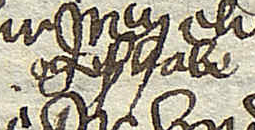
egeſ* habe
